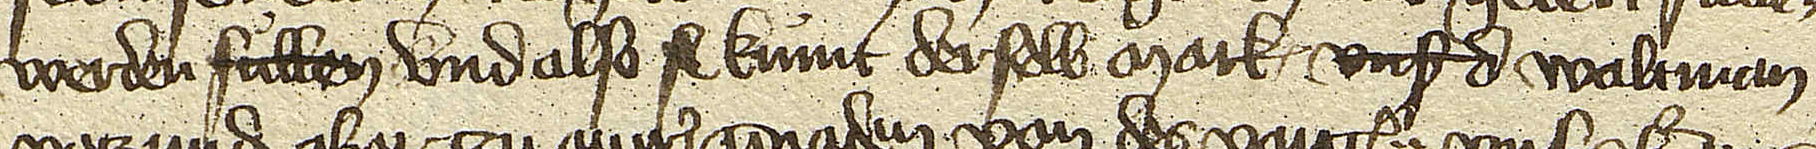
werden ſüllen vnd alſo ſ kümt derſelb Mark* vnſ* d* waltman
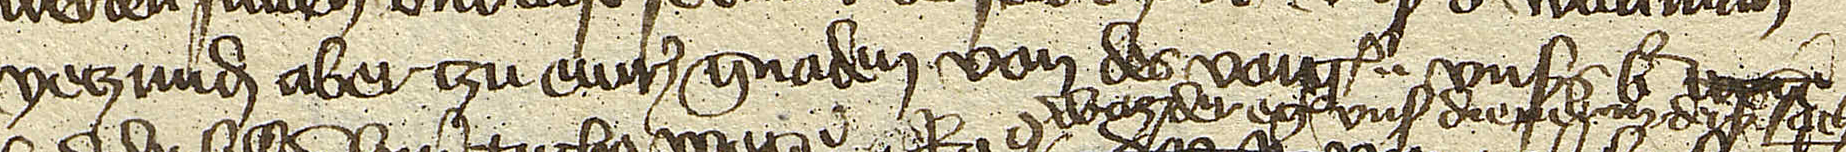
yecʒund* aber cʒu ewr* gnaden von den vorg* ~ vnſ*s b* wege*
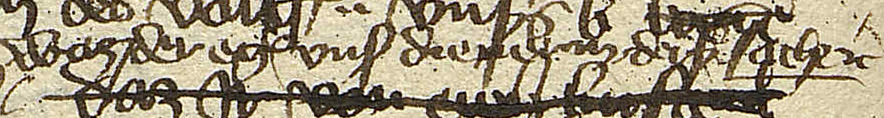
waʒ der eg* vnſ* diener in derſ* ſache ec*
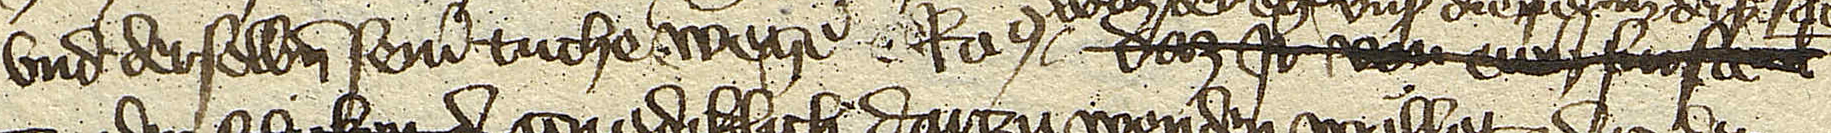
vnd derſelbn* ſein* tuche wege* Ro* / daʒ Ir von ewn* furſtlenl*
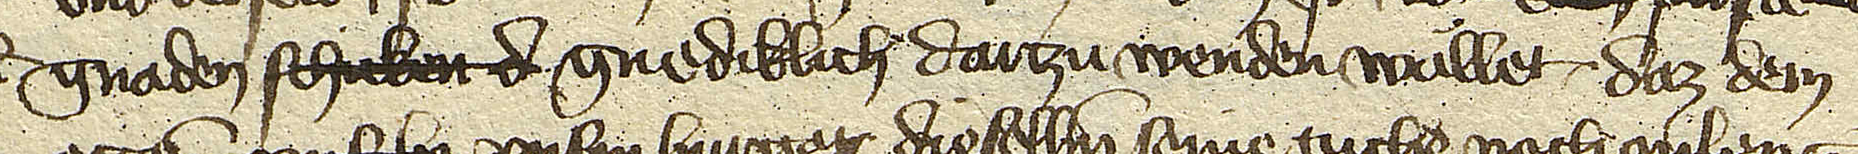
gnaden ſchicken d gnediklich darcʒu wenden wöllet / daʒ dem
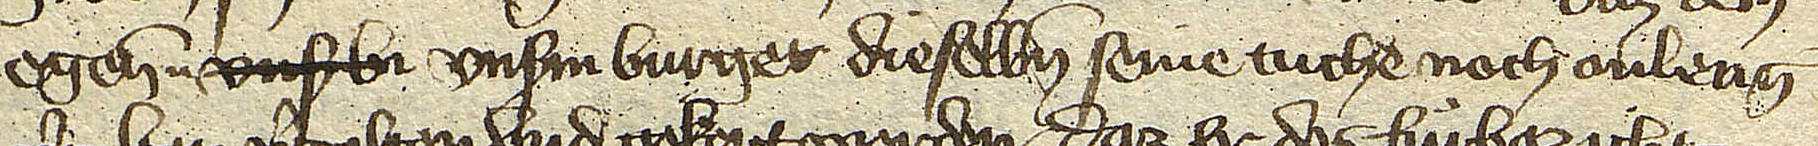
egen* ~ vnſ* b* vnſ*m burger dieſelbn* ſeine tuche noch onleng*
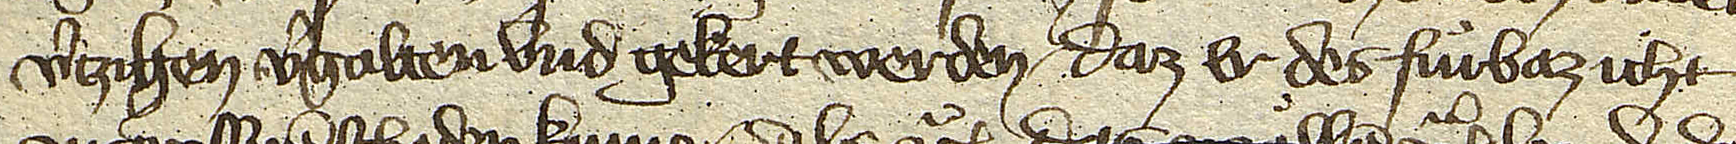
v*cʒihen v*golten vnd gekert werden / daʒ Er des fürbaʒ icht
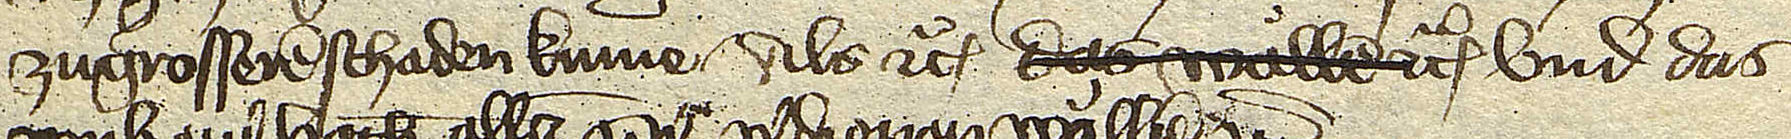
ʒugroſſere* ſchaden kume / Als ec* das wölle ec* vnd das
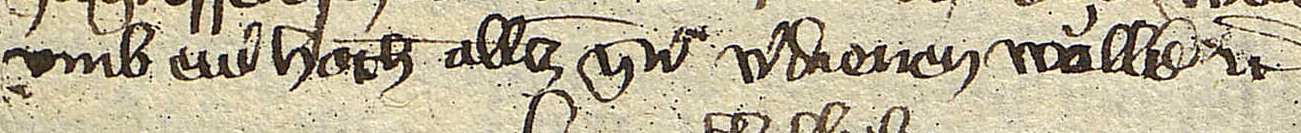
vmb ew* hoch* allcʒ* v*dienen wölle* ec*
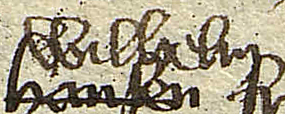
Wilhelm
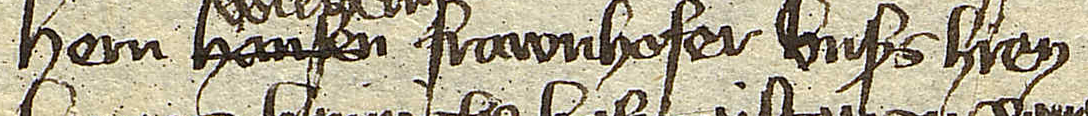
hern hanſen frawnhofer vnſ*s h*ren
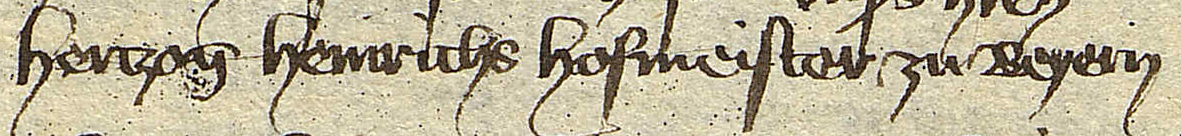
hercʒog heinrichs hofmeiſter cʒu Beyern
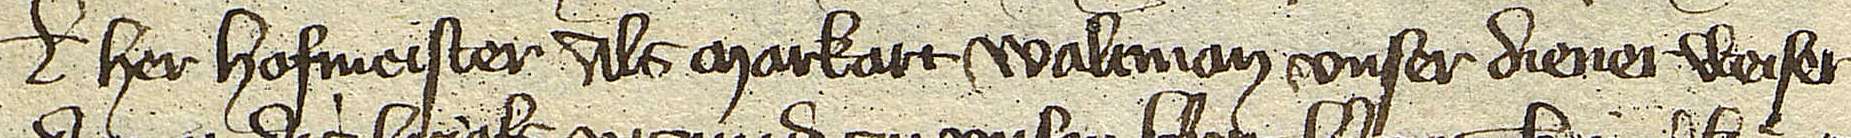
L* her hofmeiſter Als Markart waltman vnſer diener weiſer
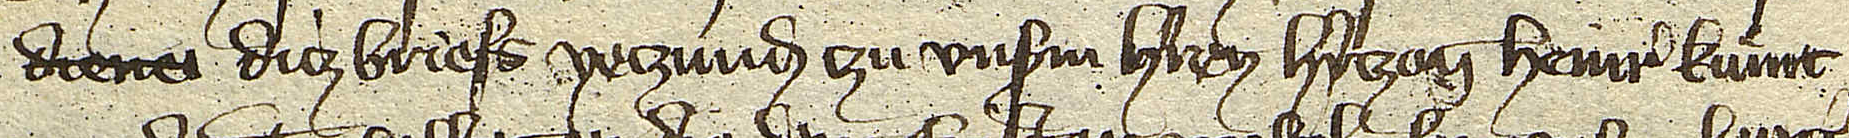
diener dicʒ briefs yecʒund* cʒu vnſ*m h*ren h*rcʒog heinr* kümt
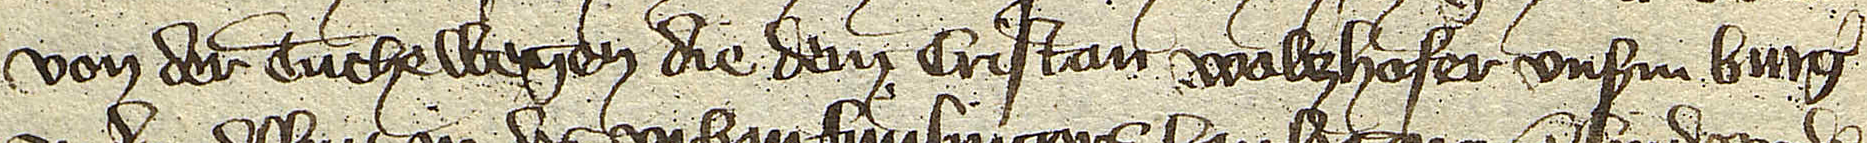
von der Tuche wegen die dem Criſtan wolcʒhofer vnſ*m burg*
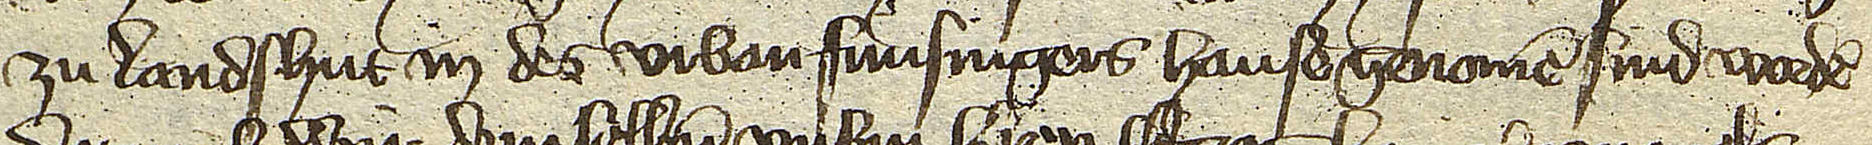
cʒu landſhut in den vrban fünſingers hauſe genome* ſind worde*
